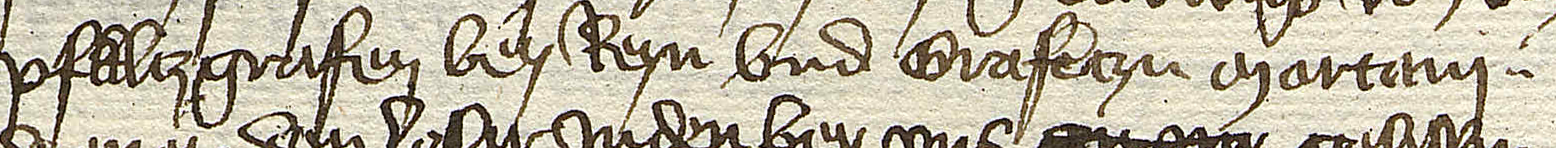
pfallcʒgrafen bey Reyn vnd Grafe* cʒu Mortani ~
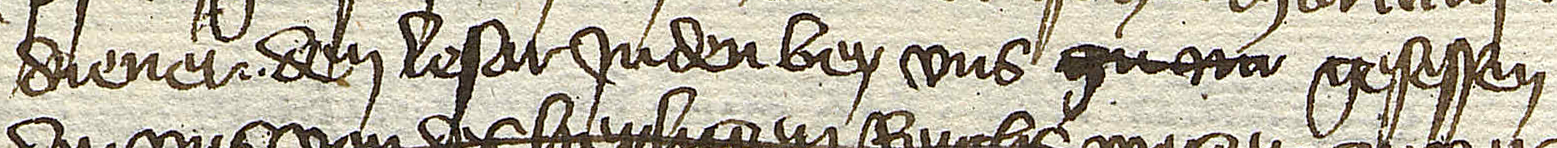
diener . den leſar Iuden bey vns ʒu nu geſeſſen
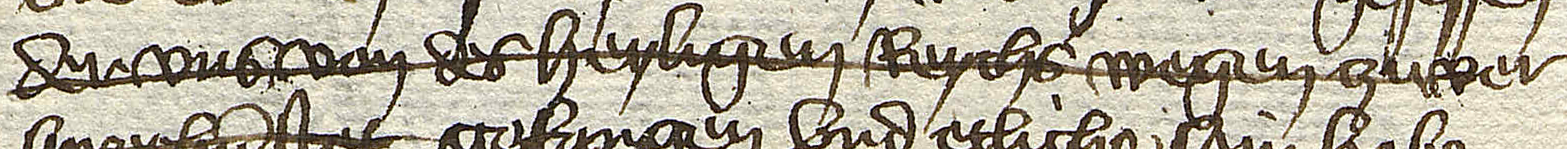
der vns von des heyligen Reychs wegen cʒu ver
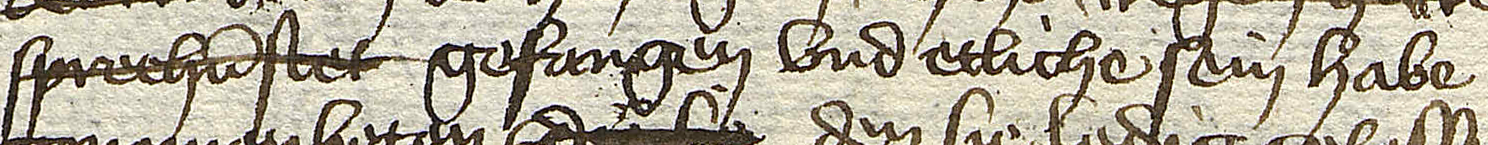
ſprech*n ſtet gefangen vnd etliche ſein habe
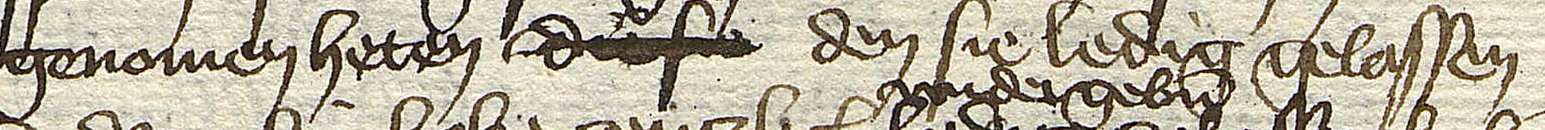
genomen heten / die ſie den ſie ledig gelaſſen
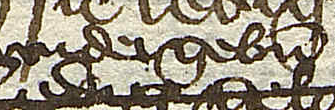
widergeb*n
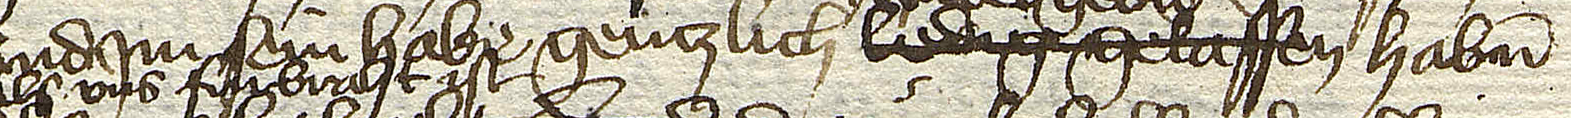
vnd Im ſein habe gencʒlich ledig gelassen hab*n
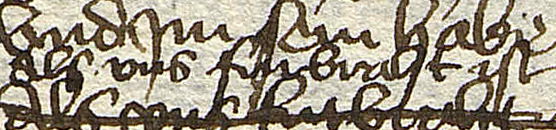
Als vns furbraht iſt
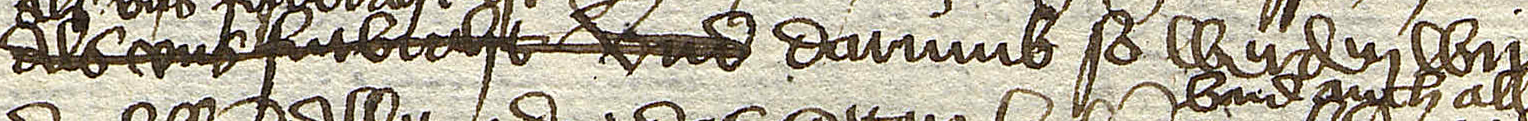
Als vns furbraht / Vnd darümb ſo werden wir
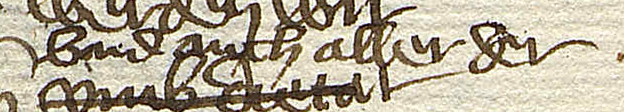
vnd auch aller der
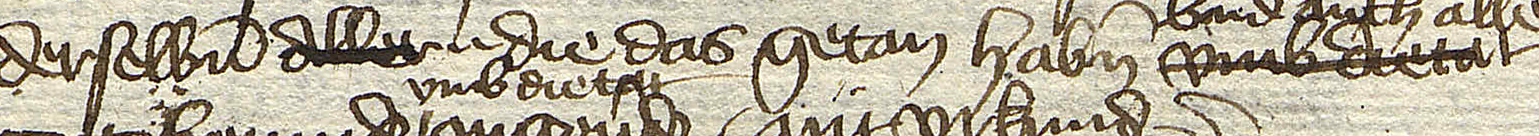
derſelb*n Aller ~ die das getan hab*n vmb die tat
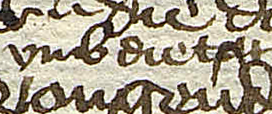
vmb die tat
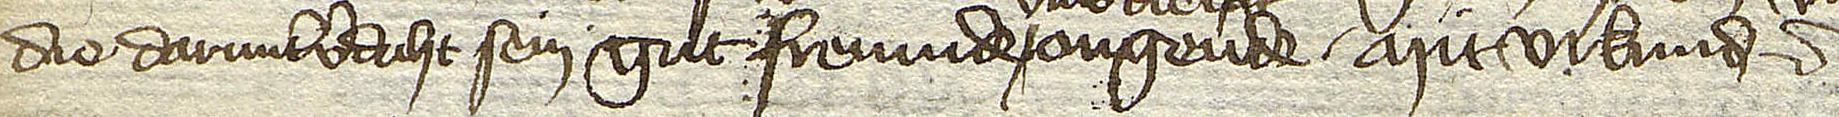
die darunt* v*dacht ſein gilt freunde ongeu*de / Mit vrkund ec*
